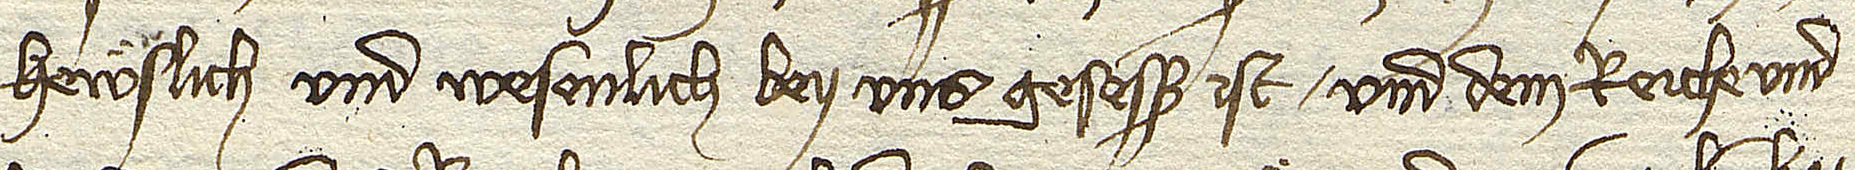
hewſlich vnd weſenlich bey vns geſeſſ* iſt / vnd dem Reiche vnd
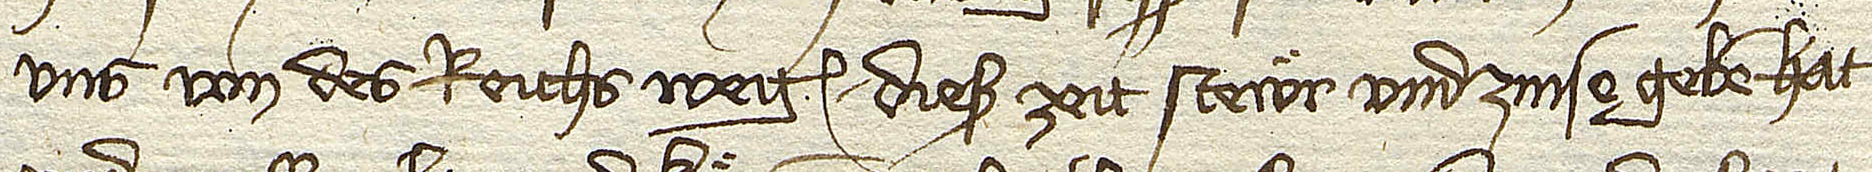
vns von des Reichs weg* / dieſ* ʒeit ſtewr vnd ʒinſe gebe* hat
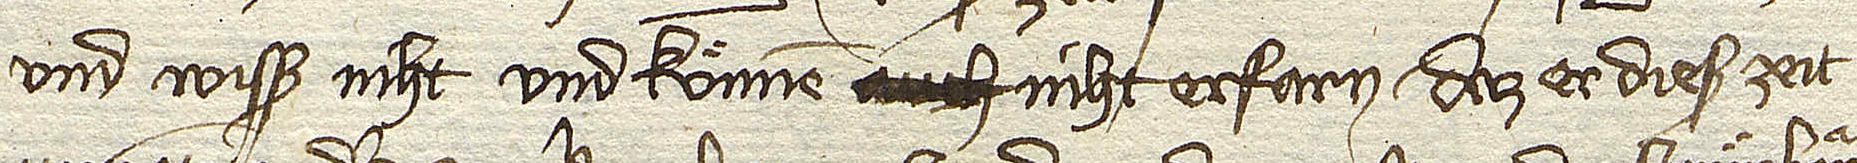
vnd wiſſ* niht vnd könne* auch niht erfarn / daʒ er dieſ* ʒeit
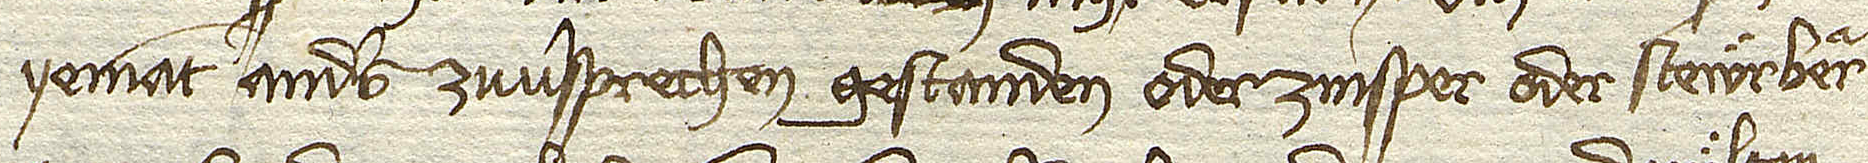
yema*t and*s ʒuu*ſprechen geſtanden oder ʒinſper oder ſtewrbër
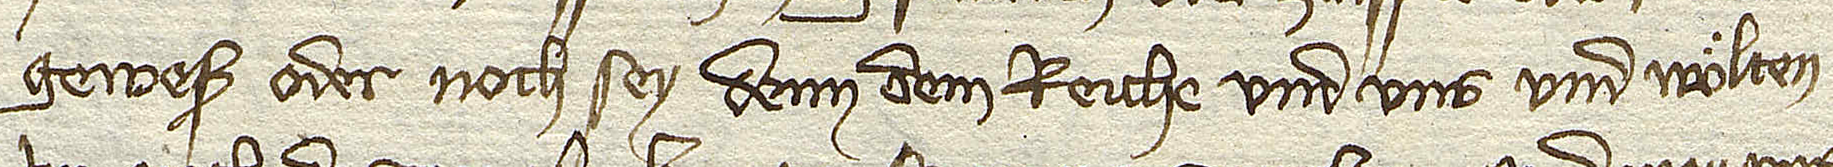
geweſ* oder noch ſey denn dem Reiche vnd vns vnd wölten
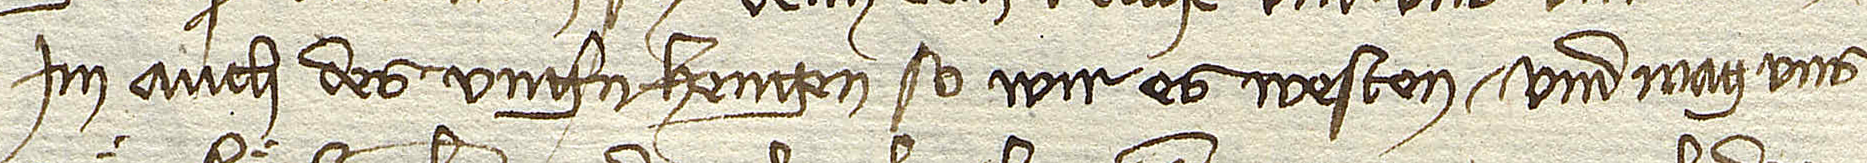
Im auch des vng*n hengen ſo wir es weſten / vnd mag vns
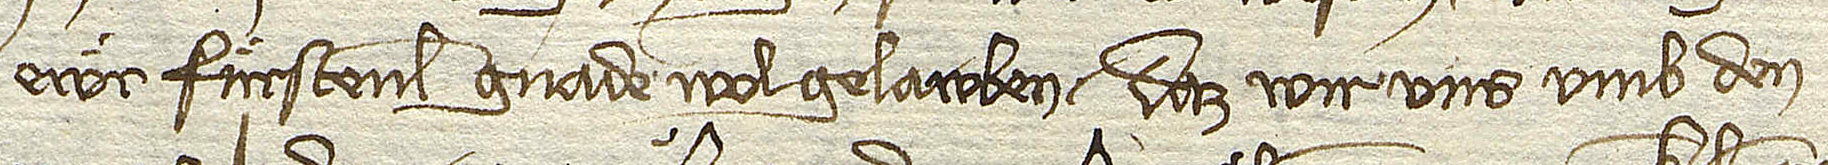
ewr fürſtenl* gnade wol gelawben / Daʒ wir vns vmb den
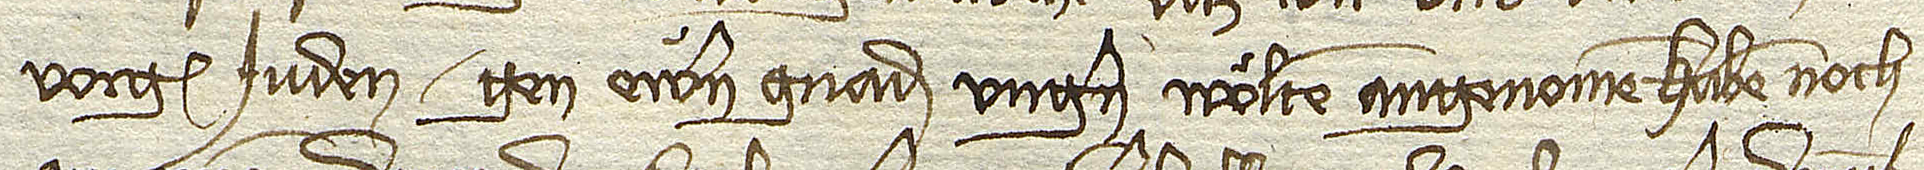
vorg* Iuden / gen ew*n gnad* vngn* wölte* angenome* habe* noch
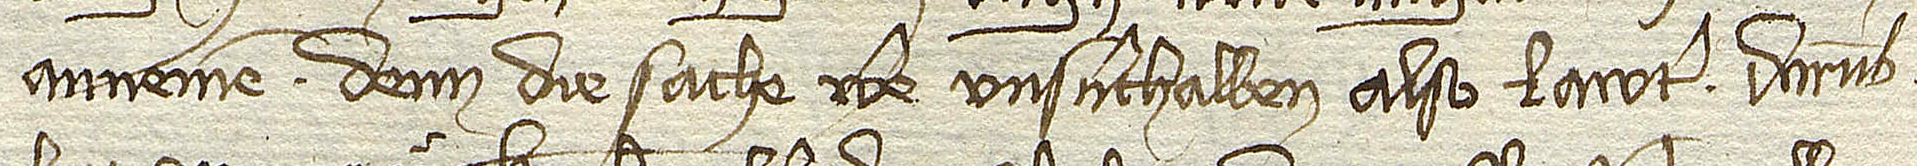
anneme* . Denn die ſache w*e vnſ*nthalben alſo lawt* . Darub*
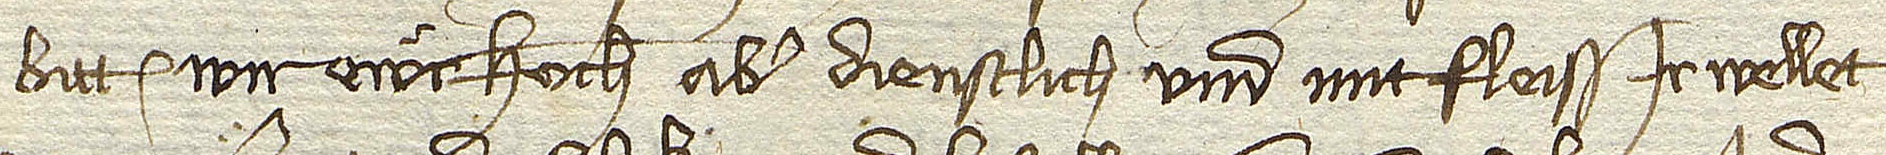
bitt* wir ewr hoch* ab* dienſtlich vnd mit fleiſſ Ir wellet
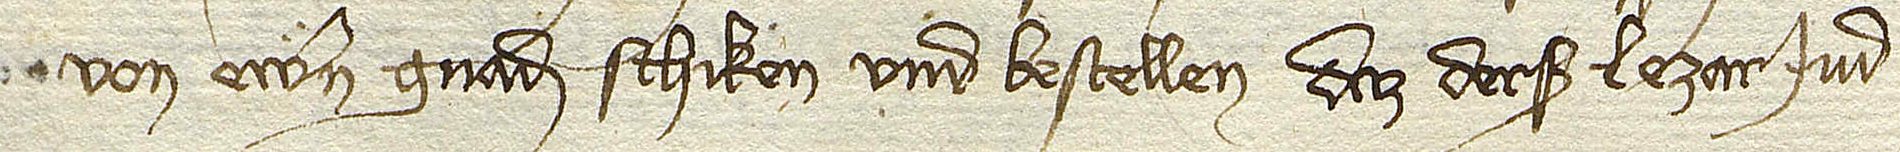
von ew*n gnad* ſchiken vnd beſtellen daʒ derſ* leʒar Iud
